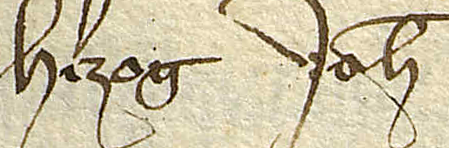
h*cʒog Ioh*
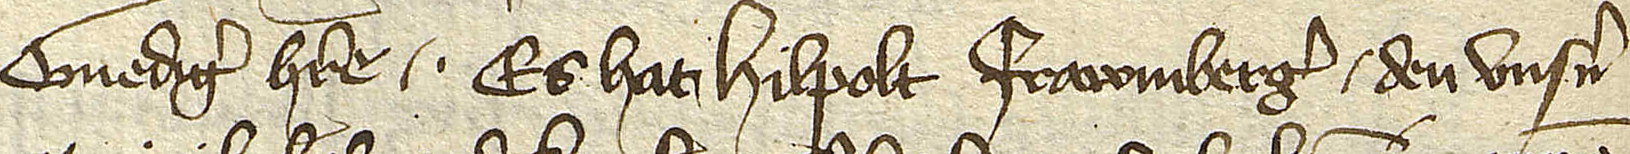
Gnedig* h*re / . Es hat Hilpolt Frawmberg* / den vnſn*
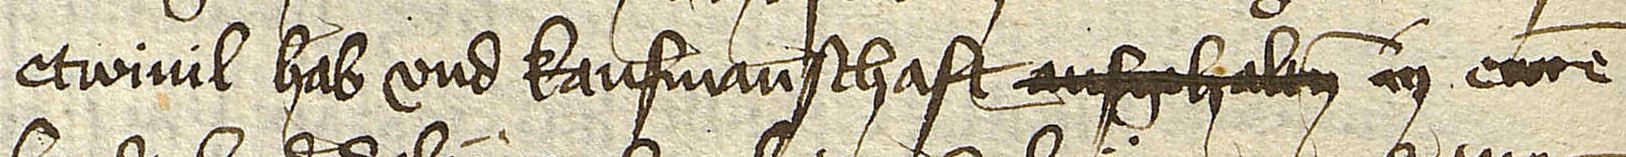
etwieuil hab vnd kaufmanſchaft aufgehaltn* in ewre*
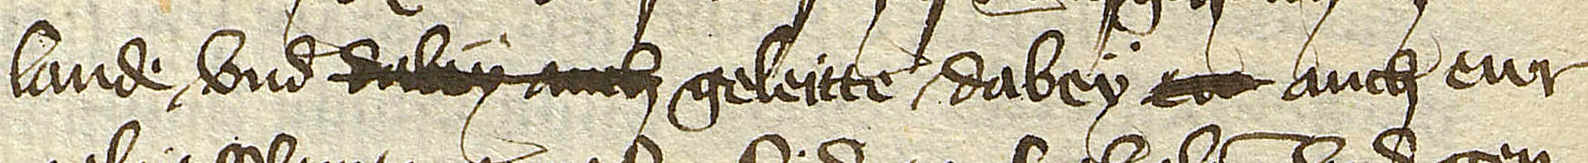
lande / vnd dabey auch geleitte / dabey ew auch ewr
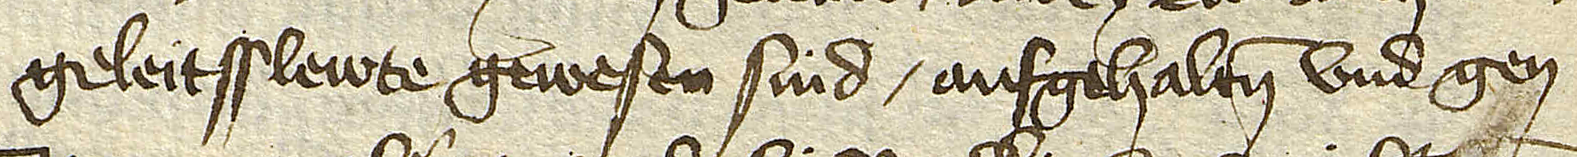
geleitſſlewte geweſen ſind / aufgehaltn* vnd gen
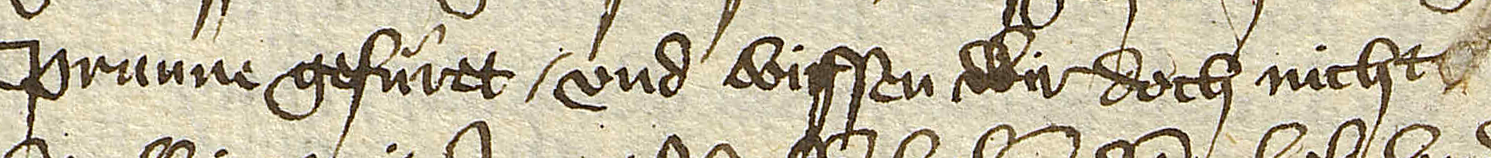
Prunne gefüret / vnd wiſſen wir doch nicht
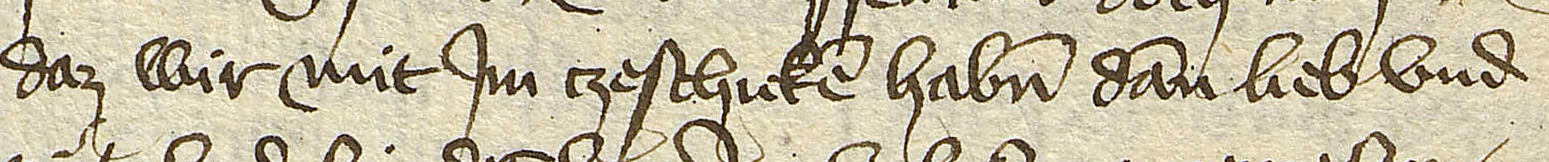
daʒ wir mit Im cʒeſchicke* habn* dan* lieb vnd
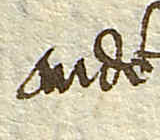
ands*
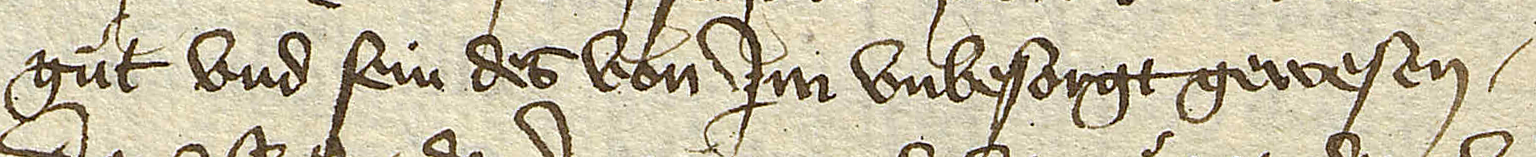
güt vnd ſein des von Im vnbeſorgt geweſen /
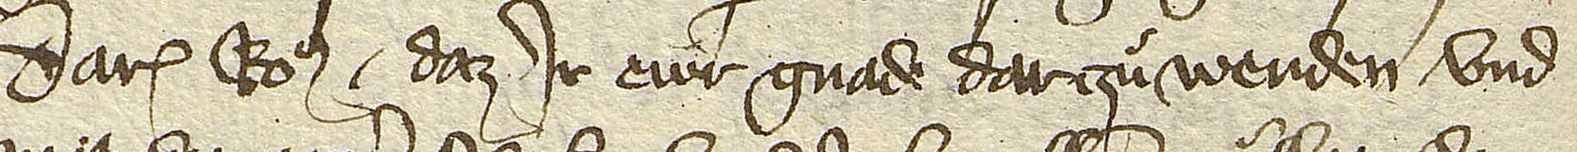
Dar* Ro* / daʒ Ir ewr gnade darcʒü wenden / vnd
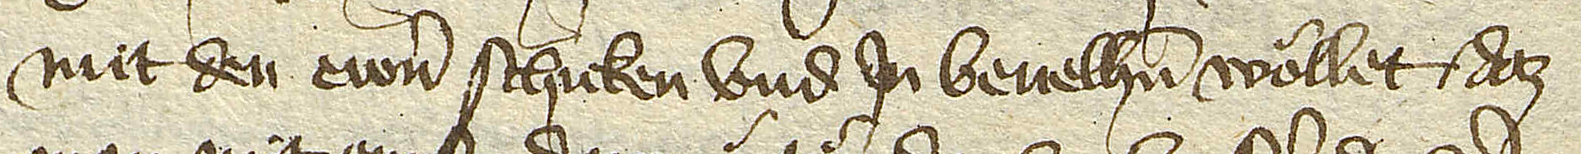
mit den ewn* ſchicken vnd In beuelhn* wöllet / daʒ
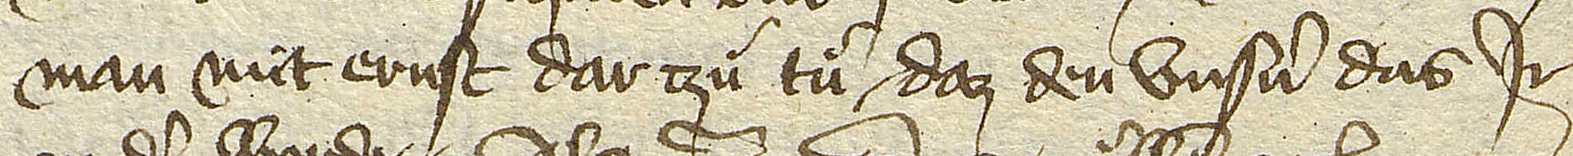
man mit ernſt dar cʒü tü / daʒ den vnſn* das Ir
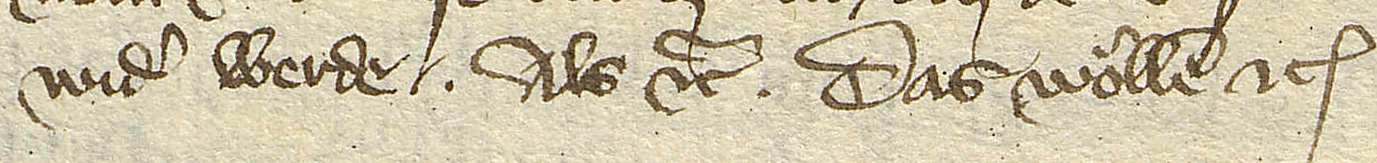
wid* werde / . Als ec* . Das wölle* ec*
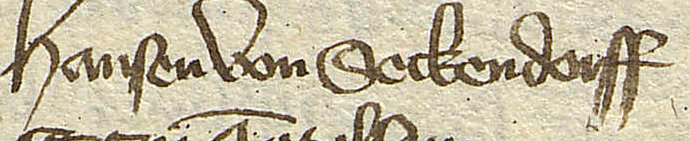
hanſen von Seckendorff
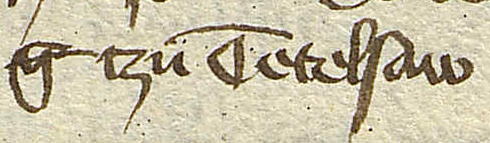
g cʒu Tetelſaw
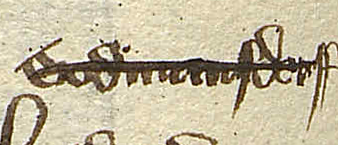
Gudmanſdorff
